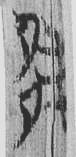邦
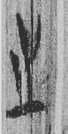之
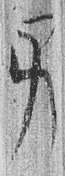子
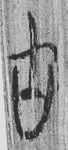古
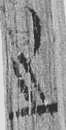之
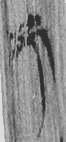力
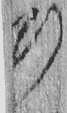乃
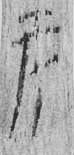下
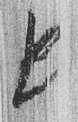上
